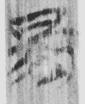昜
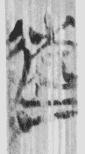遠
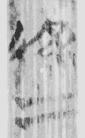逐
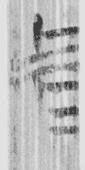上下=
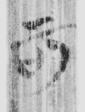可
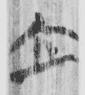立
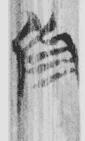於
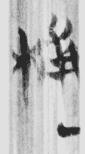{木甫}
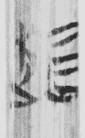𧻚
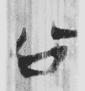公
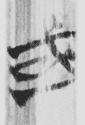或
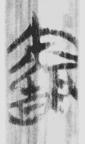{尒䎽}
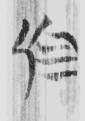於
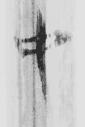中
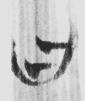曰
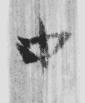中
